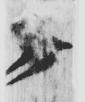少
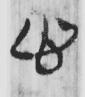心
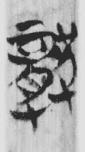{𦚏兄廾}
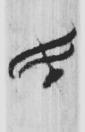民
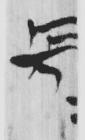長
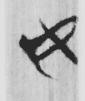女
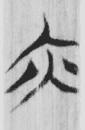亦
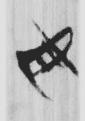母
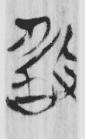敢
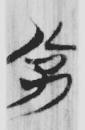㒸
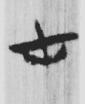才
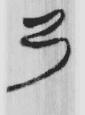乃
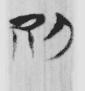死
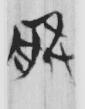服
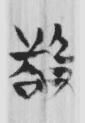敬
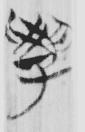學
